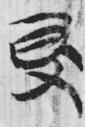○（得）
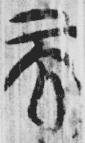而
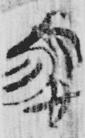惕（易）
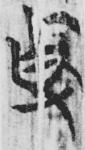史（事）
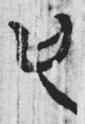也
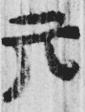亓（其）
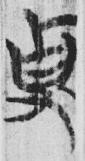史（使）
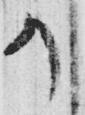人
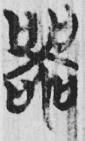器
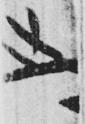之
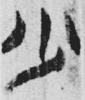少（小）
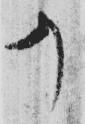人
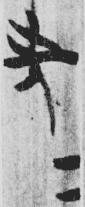先人
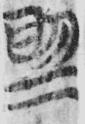則（則）
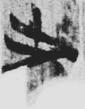之
